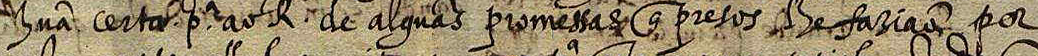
huā certa p.a ao R. de alguās promessas q̄ presos lhe faziaõ por
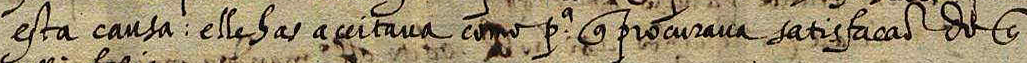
esta causa: elle has aceitaua como p.a q̄ procuraua satisfacaõ do q̄
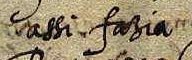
assi fazia
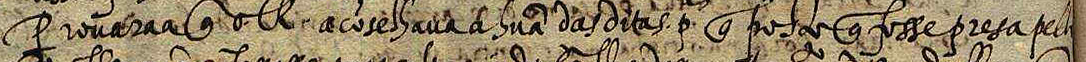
Prouaraa q̄ o R. acōselhaua a huā das ditas p.as q̄ posto q̄ fosse presa pello
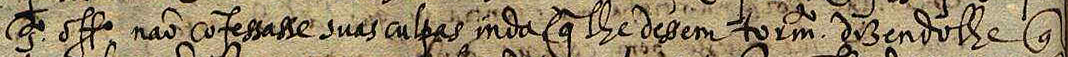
sto. offo naõ cōfessasse suas culpas inda q̄ lhe dessem torm.to dizendolhe q̄
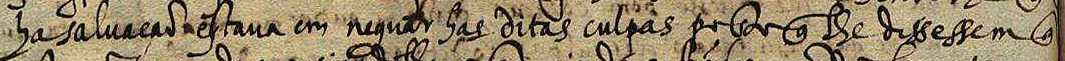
ha saluaçaõ estaua em neguar has ditas culpas posto q̄ lhe dissessem q̄
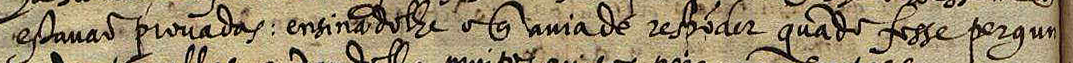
estauaõ prouadas: ensinādolhe o q̄ auia de respōder quādo fosse pergun
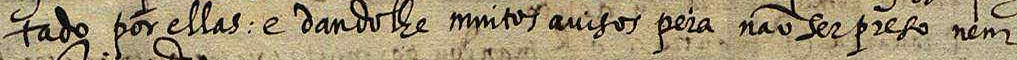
tado por ellas: e dandolhe muitos auisos pera não ser preso nem
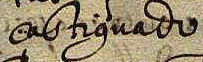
castiguado
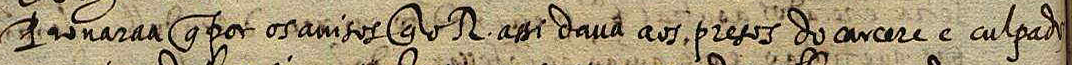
Prouaraa q̄ por os auisos q̄ o R. assi daua aos presos do carcere e culpado
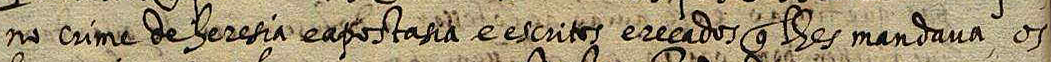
no crime de heresia e apostasia e escritos e recados q̄ lhes mandaua os
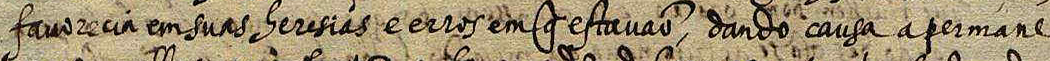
fauorecia em suas heresias e erros em q̄ estauaõ, dando causa a permane
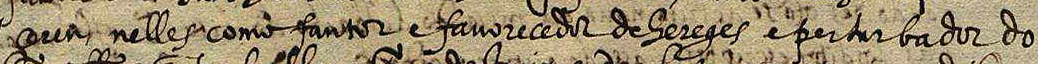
cerem nelles como fautor e fauorecedor de hereges e perturbador do
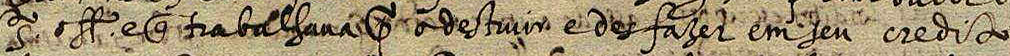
sto. off.o e q̄ trabalhaua p̄o o destruir e desfazer em seu credito
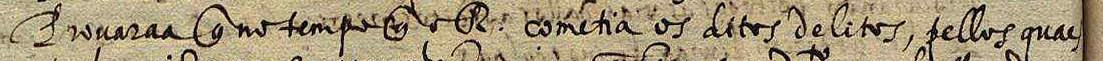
Prouaraa q̄ no tempo q̄ o R. cometia os ditos delitos, pellos quaes
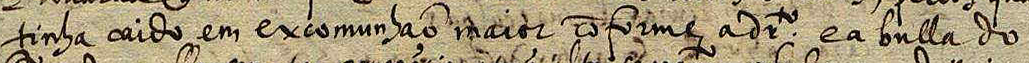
tinha caido em excomunhaõ maior cōforme a drto. e a bulla do
